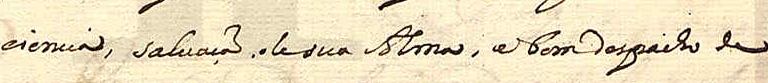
ciencia, saluação de sua Alma, e bom despacho de
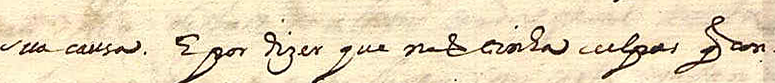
sua causa. E por dizer que naõ tinha culpas q̄ con
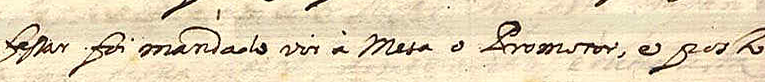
fessar foi mandado vir à Mesa o Promotor, e posto
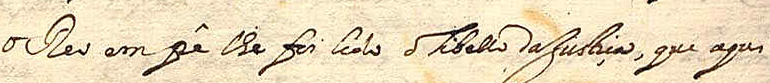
o Reo em pê lhe foi lido o Libello da Justiça, que aqui
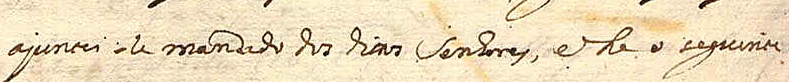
ajuntei de mandado dos dittos Senhores, e he o seguinte.
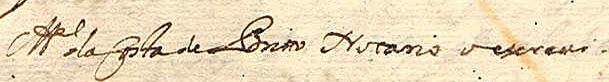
Mel da Costa de Britto Notario o escreui.
